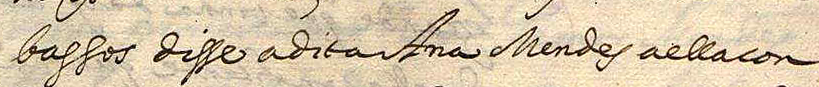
bas sos disse a dita Ana Mendes a ella con
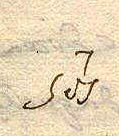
Sós
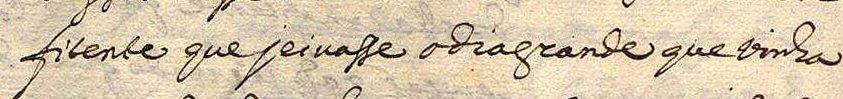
fitente que jeiuasse o dia grande que vinha
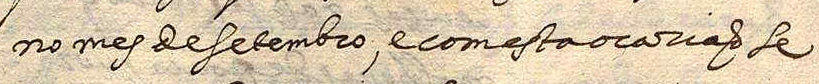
no mes de setembro, e com esta ocaziaõ se
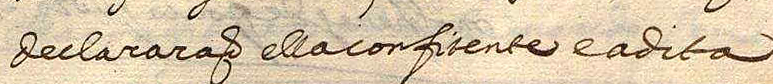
declararaõ ella confitente e a dita
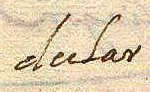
declar
